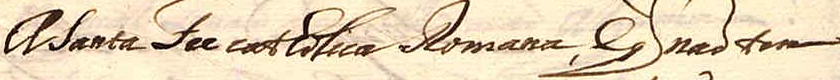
A Santa Fee catholica Romana, E q̄ naõ tem
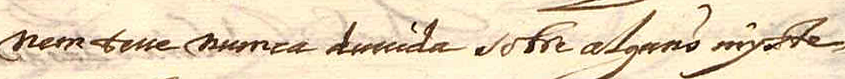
nem teue numca duuida sobre alguns myste
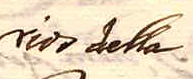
rios della.
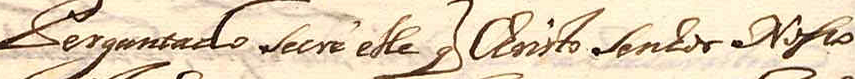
Perguntado se cré elle q̄ Christo Senhor Nosso
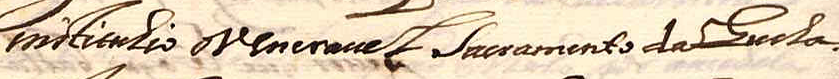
instituhio o veneraueL Sacramento da Eucha
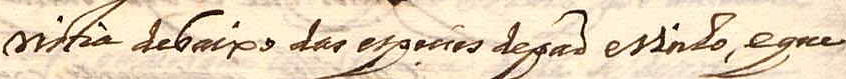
ristia debaixo das espeçies de paõ e vinho, e que
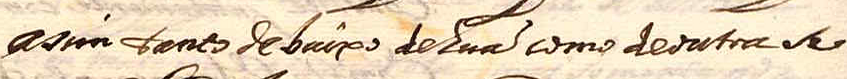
asim tanto debaixo de huā como de outra se
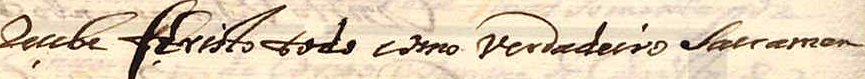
Reçebe Christo todo como verdadeiro Sacramen
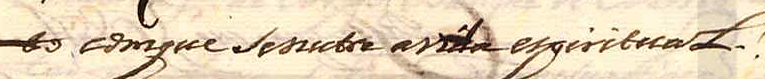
to com que se nutre a vida espirituaL?
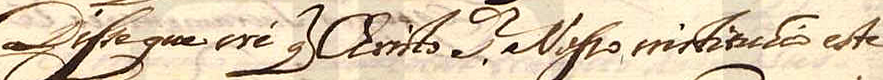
Disse que cré q̄ Christo s.or Nosso instituhio este
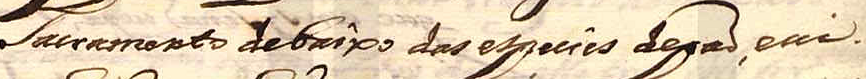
Sacramento debaixo das espeçies de paõ, e ui
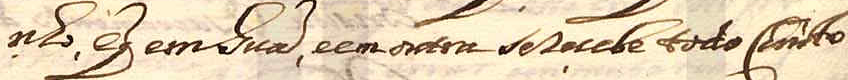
nho, e q̄ em huā, e em outra se reçebe todo Christo.
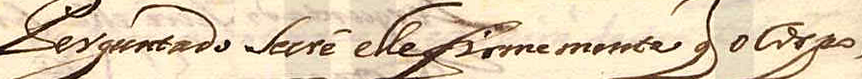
Perguntado se cré elle firmemente q̄ o corpo,
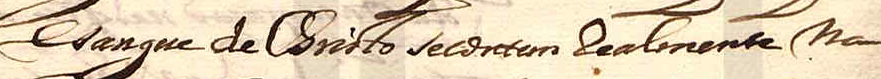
e sangue de Christo se contem Realmente na
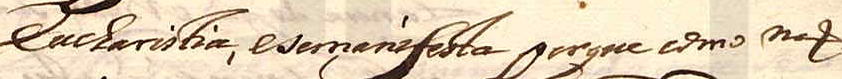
Eucharistia, e se manifesta porque como naõ
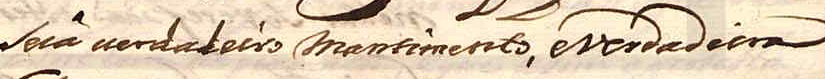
será uerdadeiro mantimento, e verdadeira
